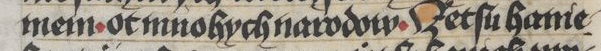mem.ot mnohych narodow.Żetſu hanie¬
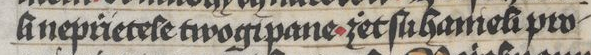li nepṙietele twogi pane.żet ſu hanieli pro¬
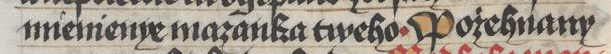mnienienye mazanka tweho.Pożehnany
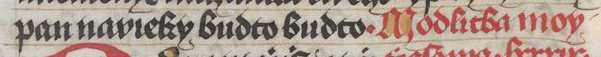pan navieky budto budto.Modlitba moy
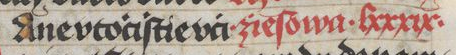Ane vtoċiẛtie vċi.żieſowa.lxxxix.
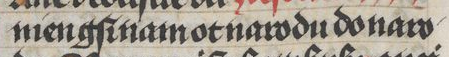nien gſi nam ot narodu do naro¬
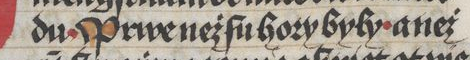du.Prwe neżſu hory byly.a neż
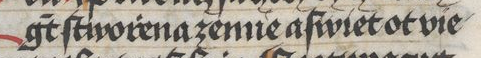ḡt ſtwoṙena zemie a ſwiet ot vie¬
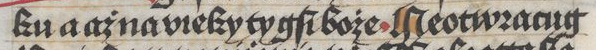ku a aż na vieky ty gſi boże.Neotwracug
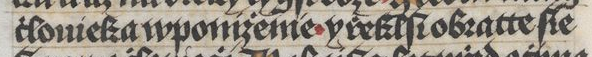ċlouieka wponiżenie.y ṙeklſi obratte ſie
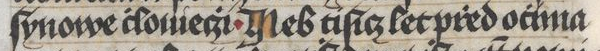ſynowé ċlouiecżi.Neb tiſicz let pṙed oċima
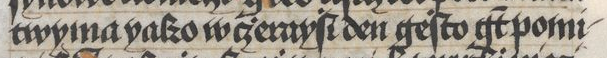twyma yako w cżerayẛi den geẛto ḡt pomi¬
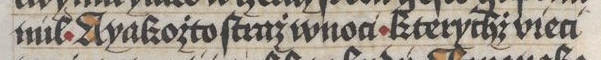nul.A yakożto ſtraż wnoci.kterychż vieci
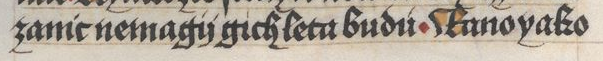zanic nemagij gich leta budú.Rano yako
